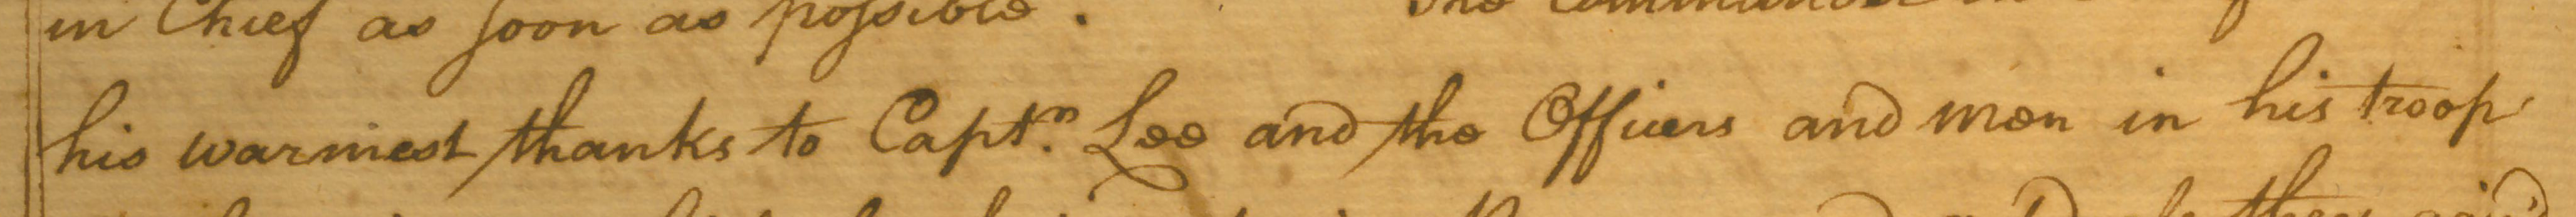his warmest thanks to Capt^n. Lee and the Officers and men in his troop
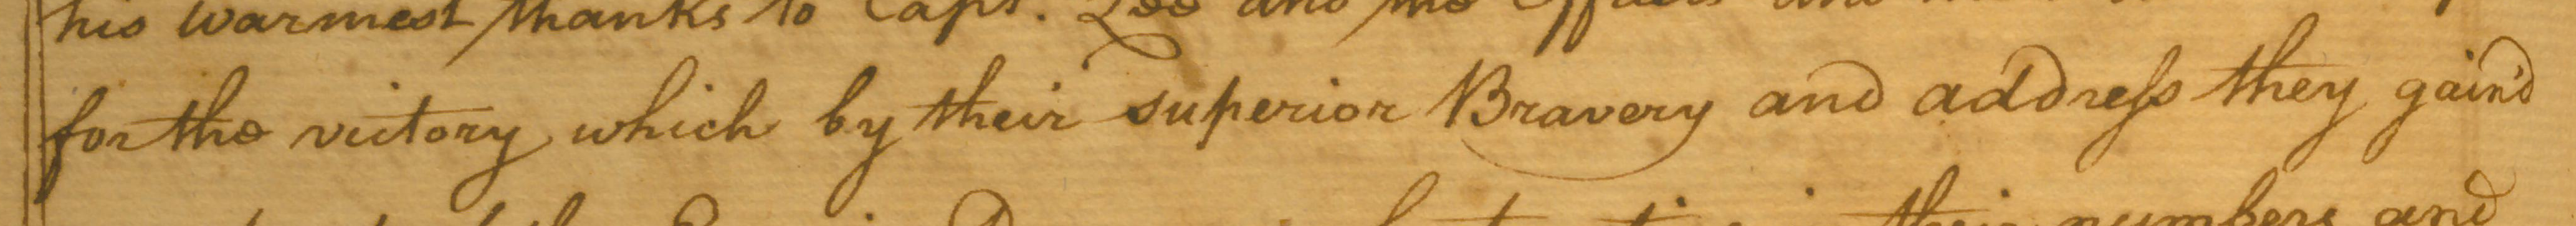for the victory which by their superior Bravery and address they gain'd
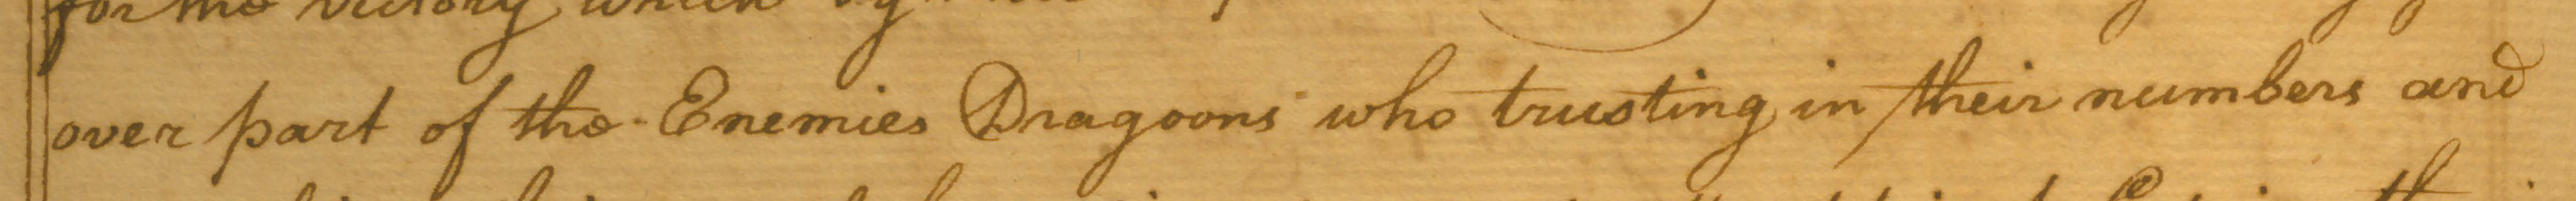over part of the Enemies Dragoons who trusting in their numbers and
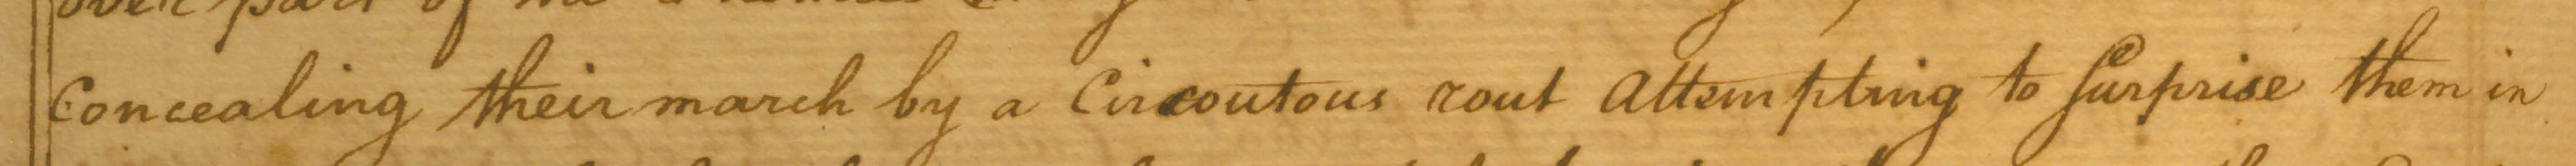concealing their march by a circoutous rout attempting to surprise them in
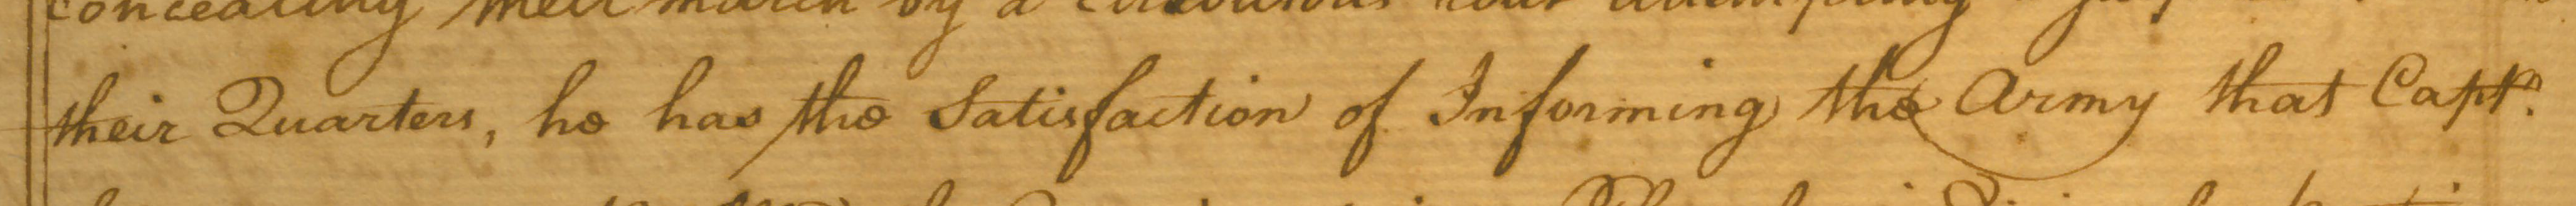their Quarters, he has the Satisfaction of Informing the Army that Capt^n.
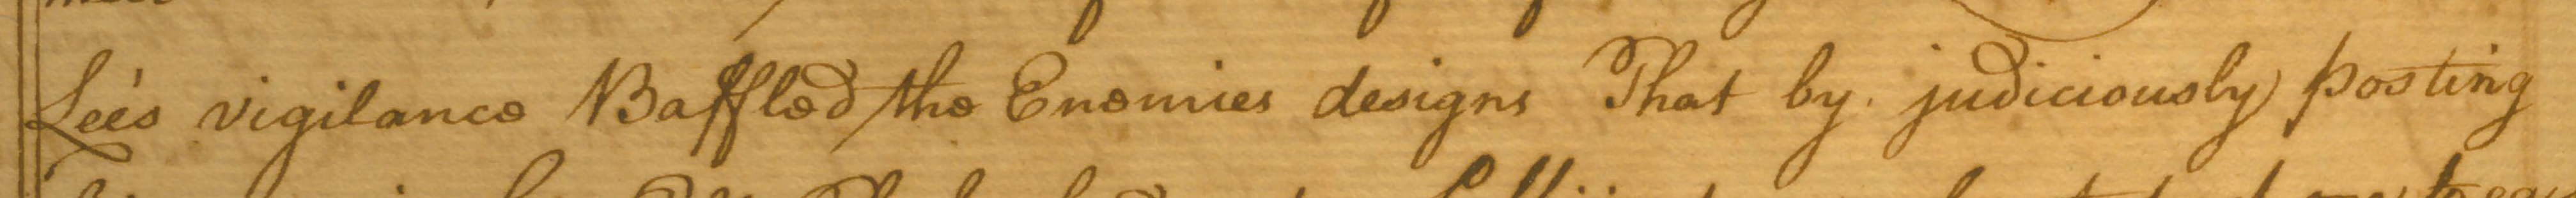Lee's vigilance Baffled the Enemies designs That by judiciously posting
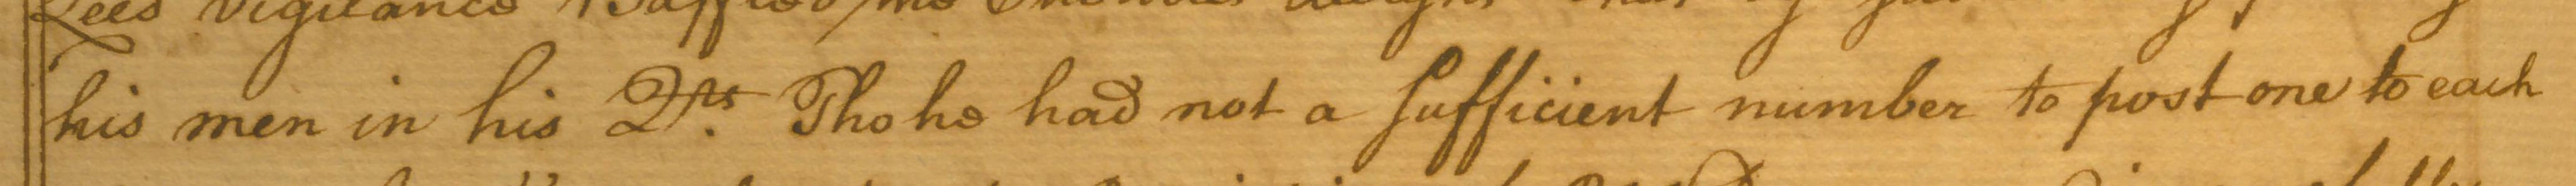his men in his Q^rs. Tho he had not a sufficient number to post one to each
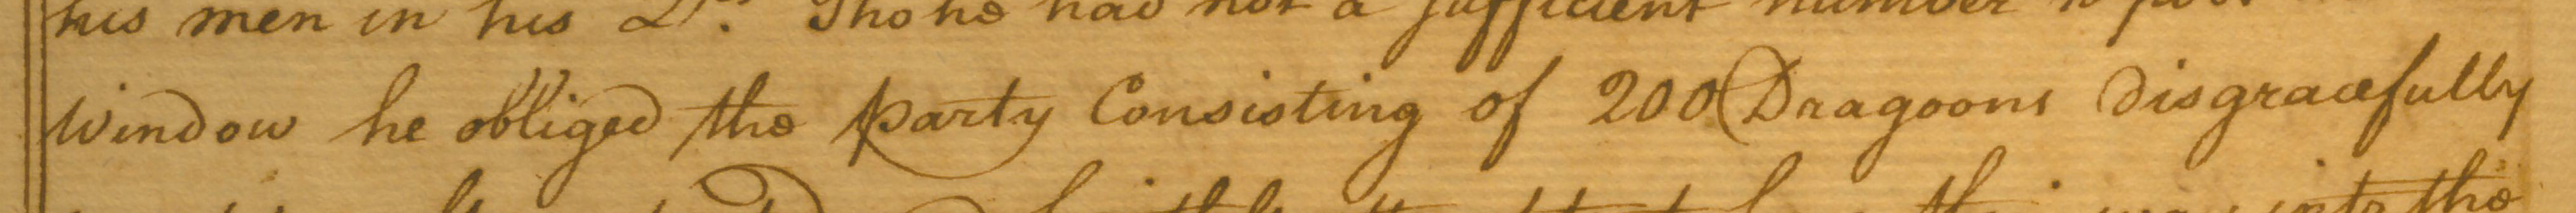window he obliged the party consisting of 200 Dragoons disgracefully
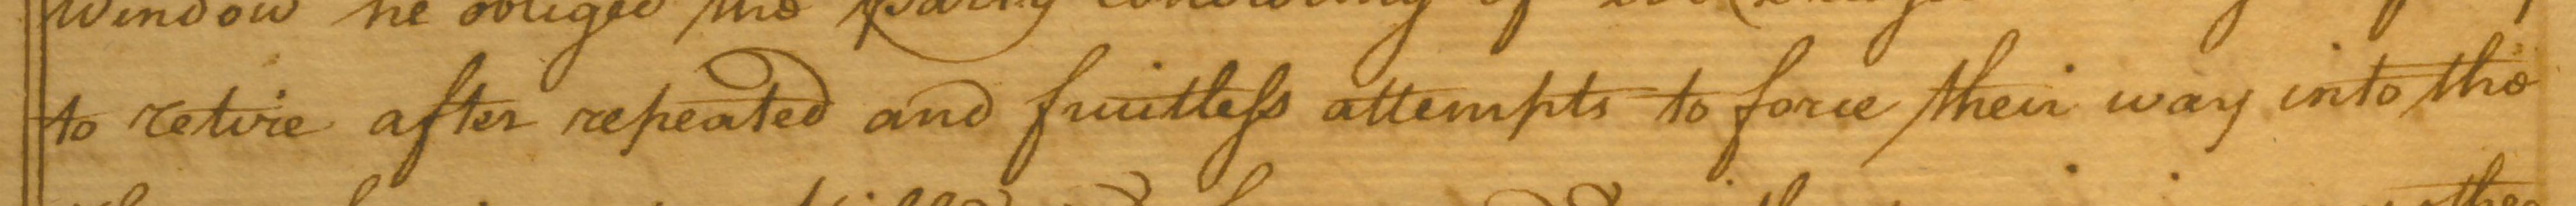to retire after repeated and fruitless attempts to force their way into the
